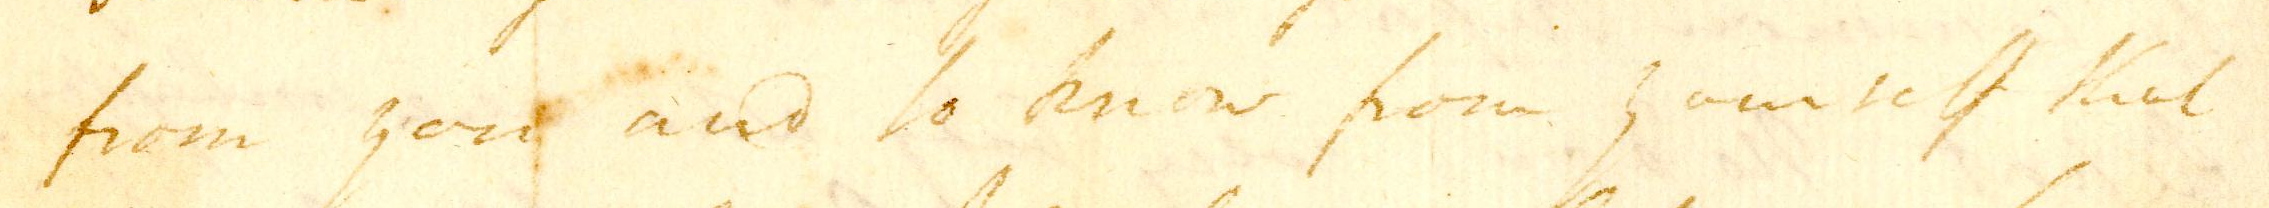from you and to know from yourself that
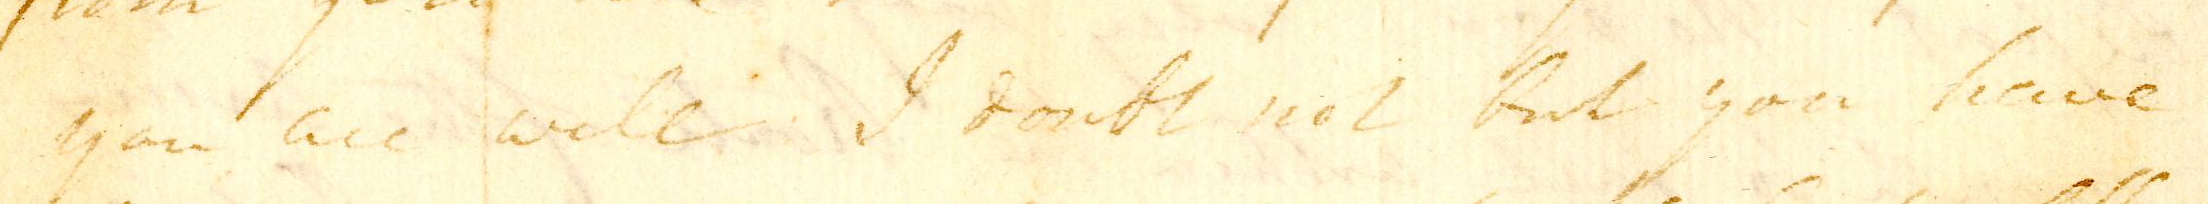you are well I doubt not but you have
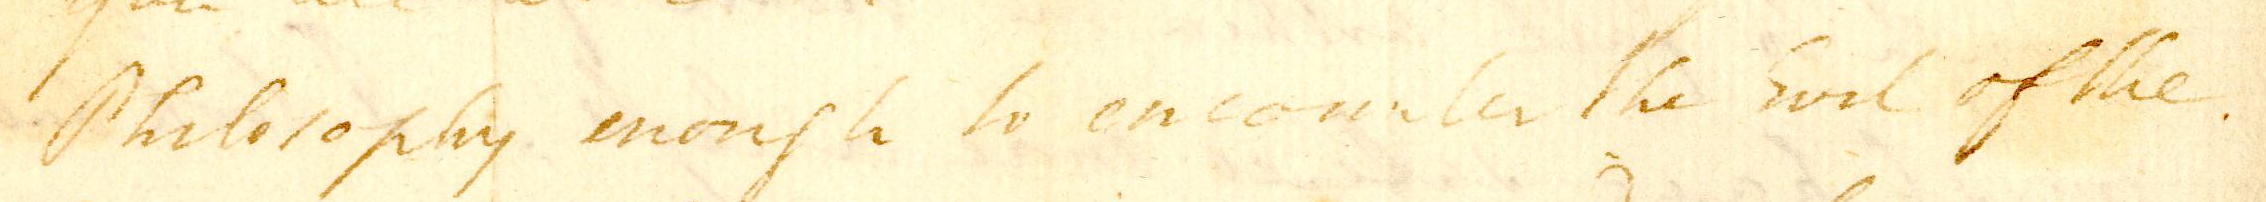Philosophy enough to encounter the Evil of the
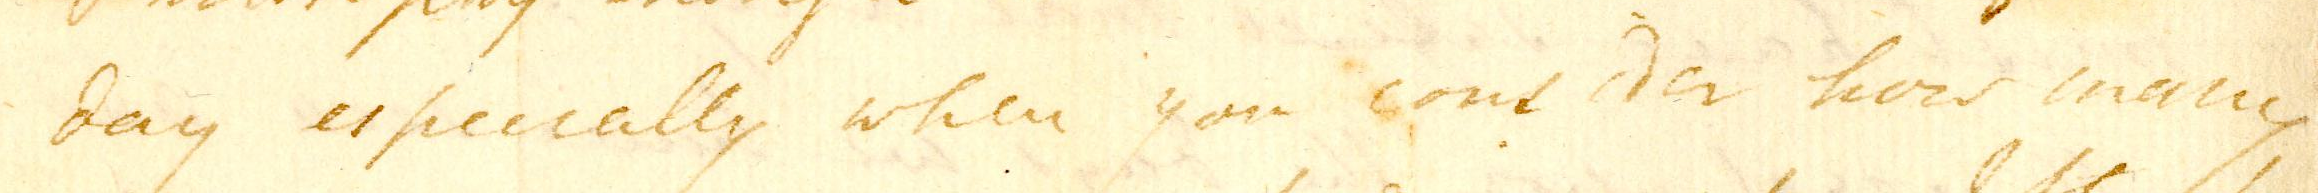day especially when you consider how many
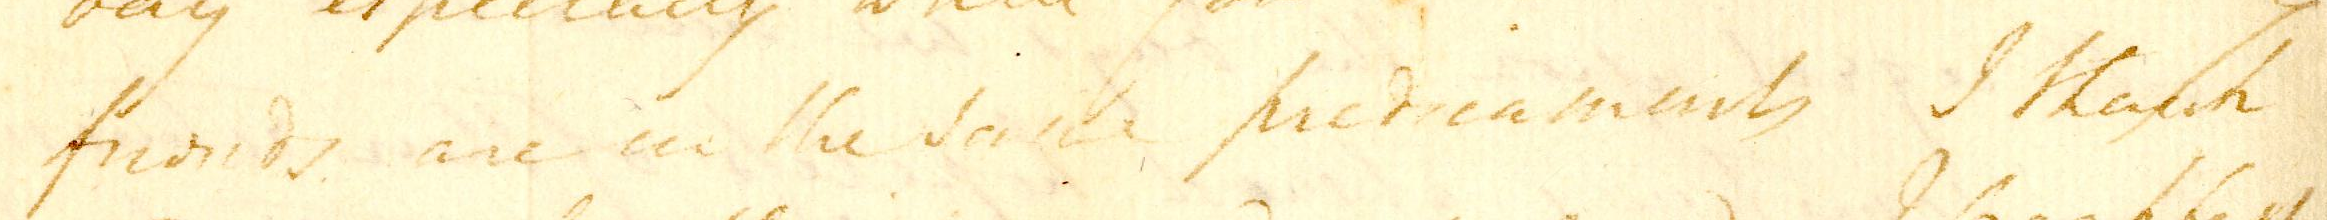friends are in the same predicaments I thank
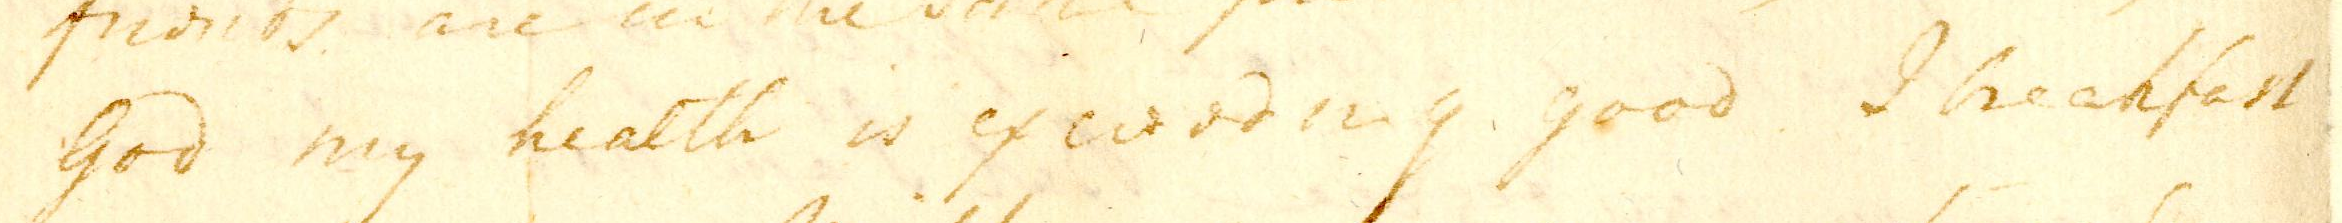God my health is exceeding good I breakfast
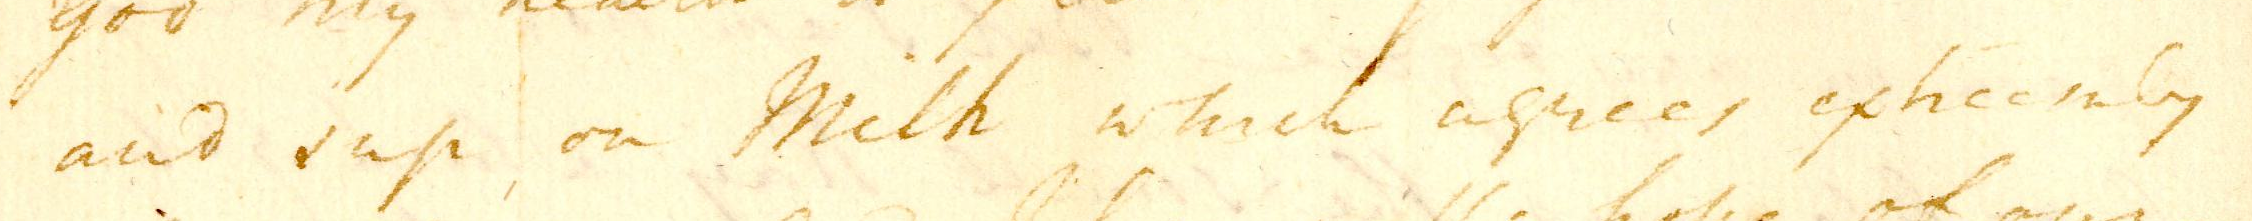and sup on Milk which agrees extreemly
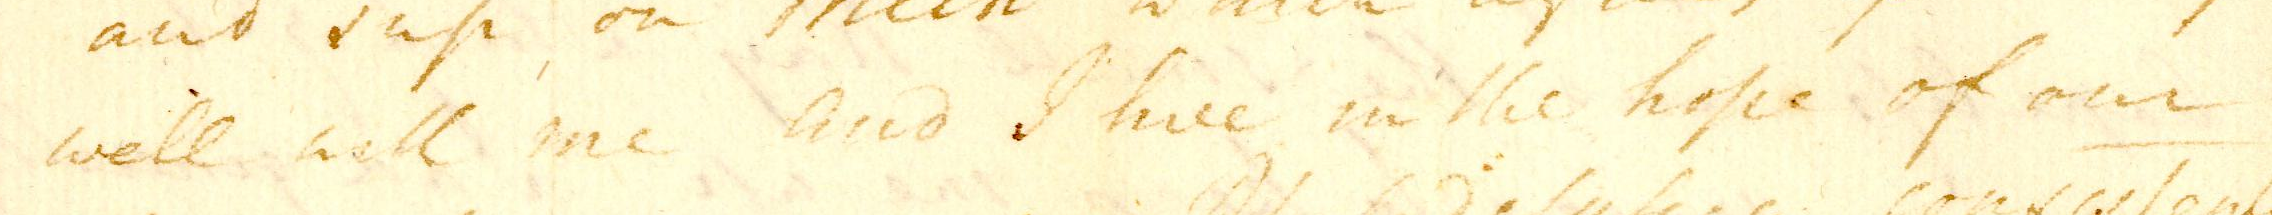well with me And I live in the hope of our
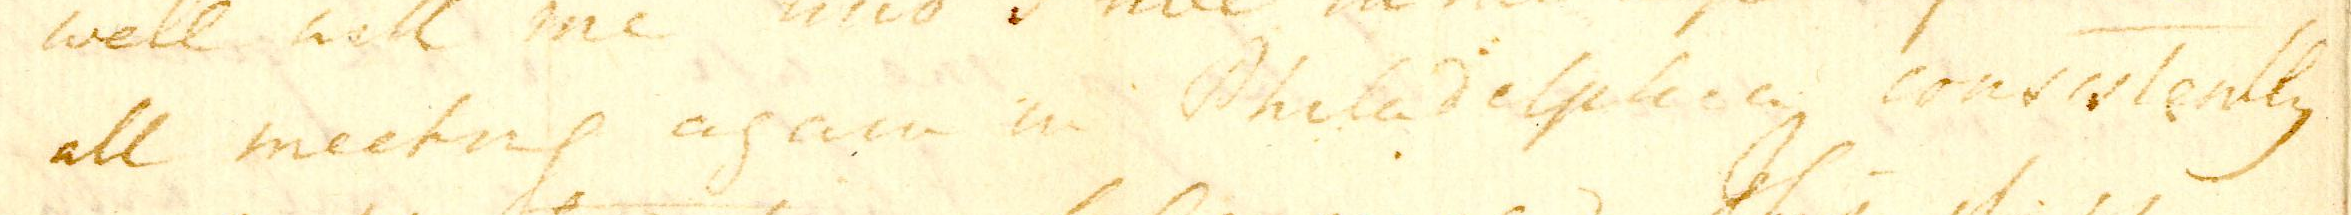all meeting again in Philadelphia consistently
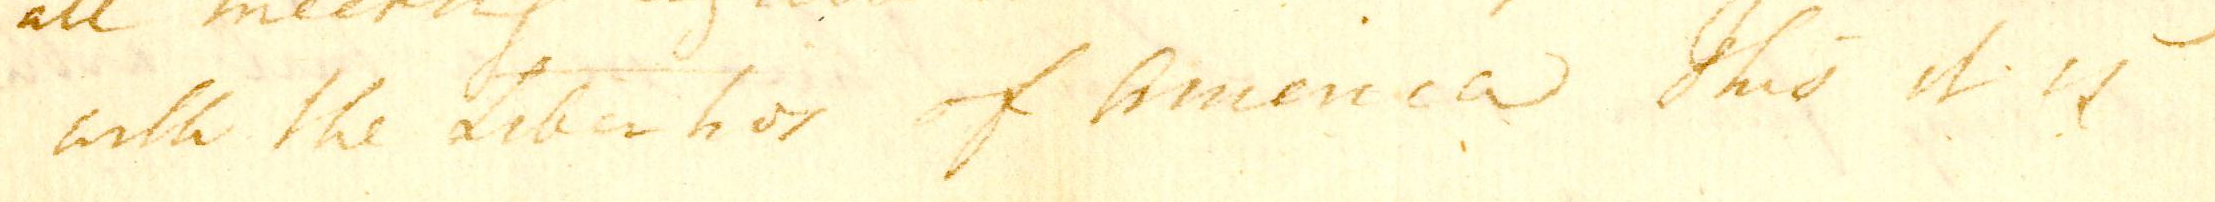with the Liberties of America This it is
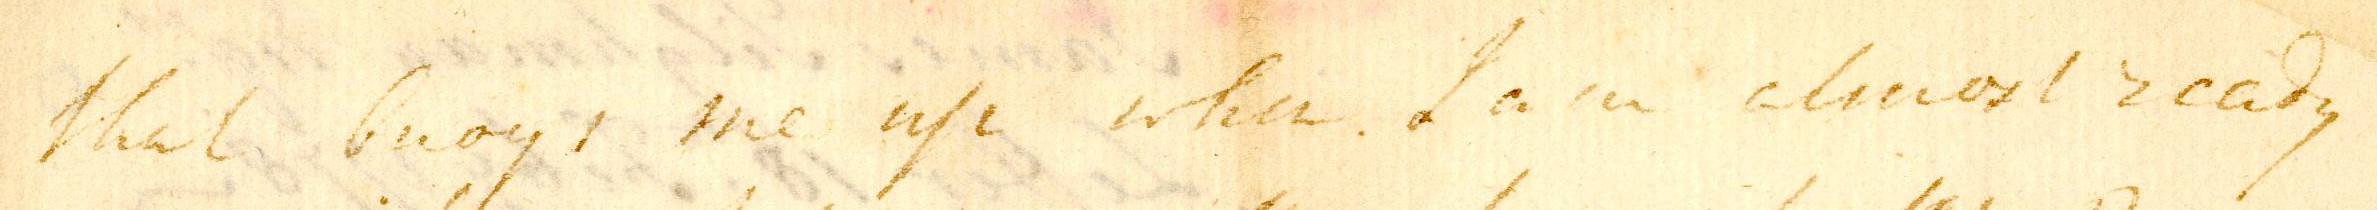that buoys me up when I am almost ready
